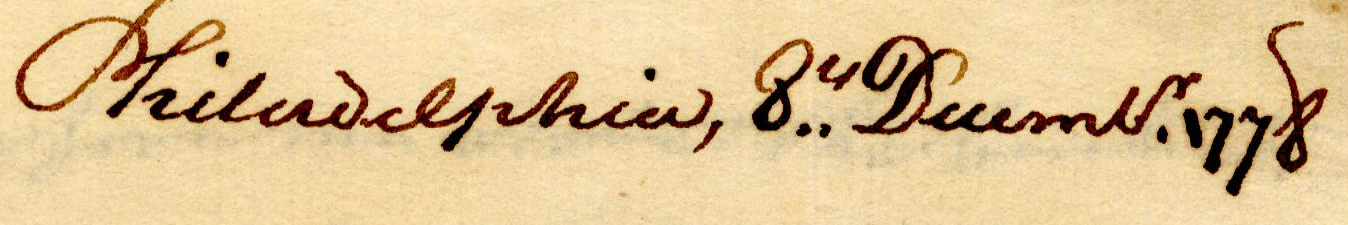Philadelphia, 8^th Decemb^r. 1778
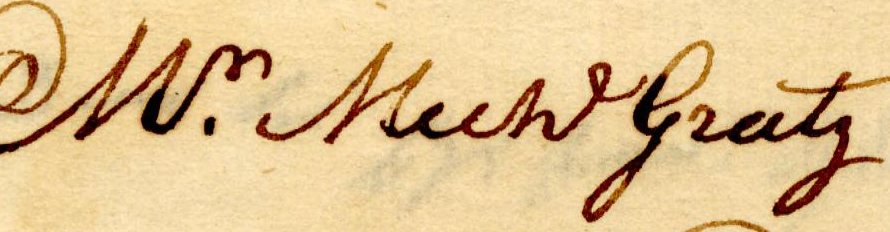M^r Mich^l Gratz
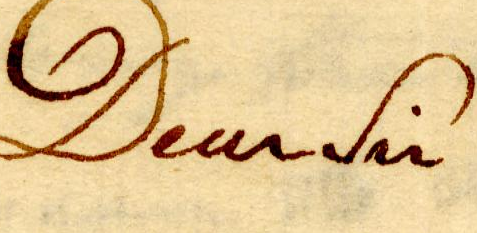Dear Sir
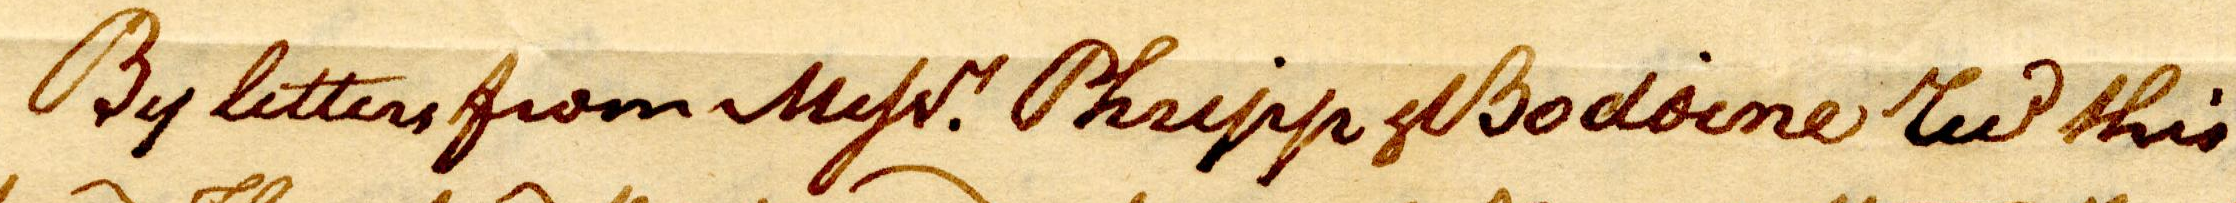By letters from Mess^rs. Philipp & Bodoine rece^d this
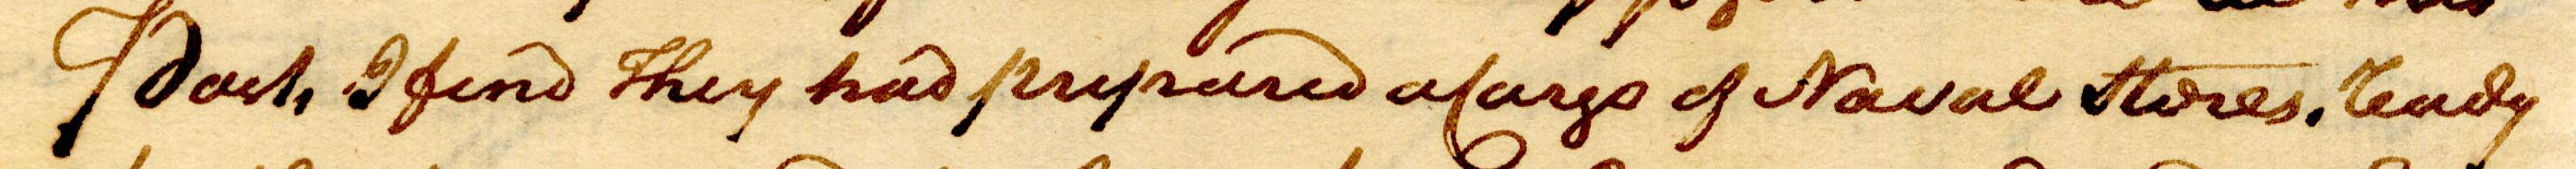7 dece^r, I find they had prepared a cargo of Naval stores, ready
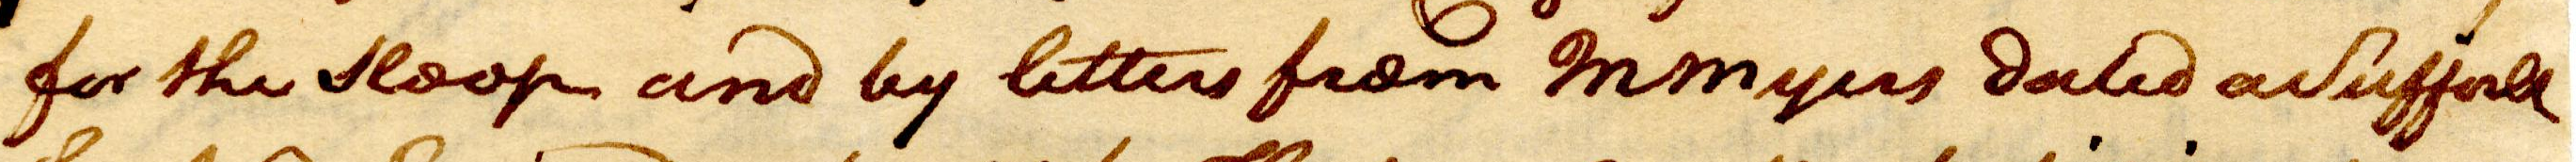for the sloop and by letters from M Myers dated a Suffolk
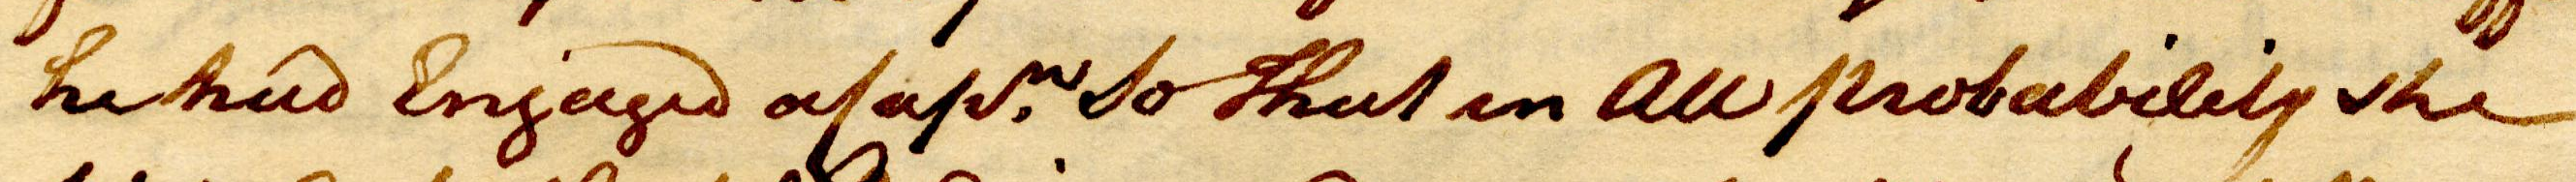he had Engaged a Cap^n. so that in All probability she
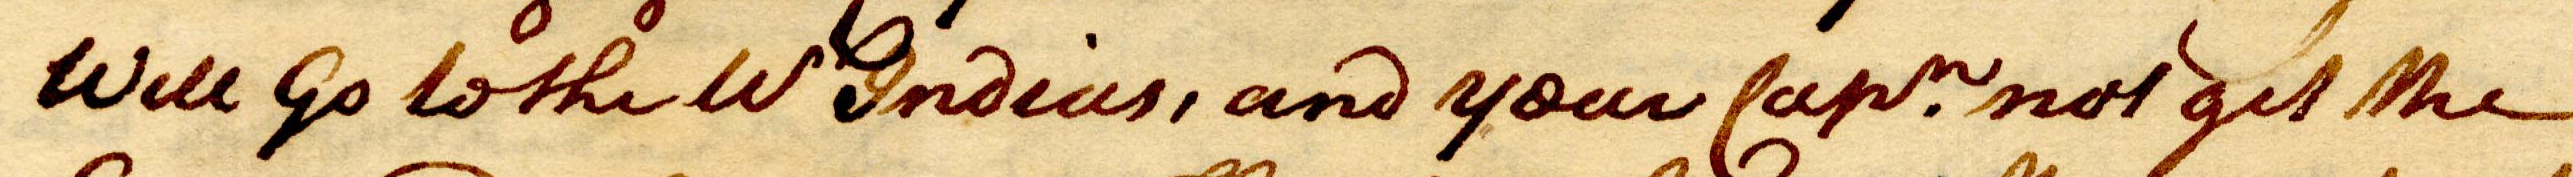will go to the W Indias, and your Cap^n. not get the
